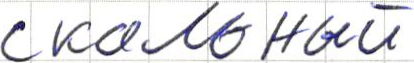скальный
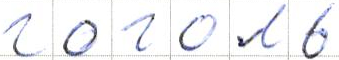гоголь
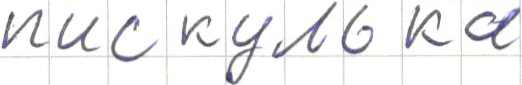пискулька
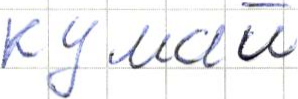кумай
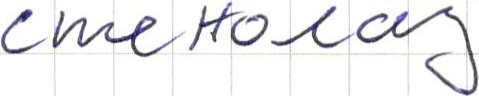стенолаз
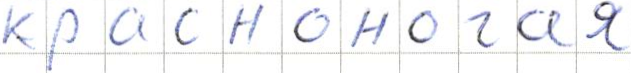красноногая
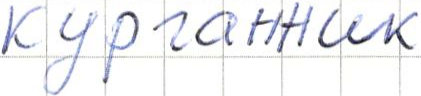курганник
